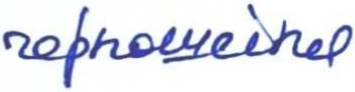черношейная
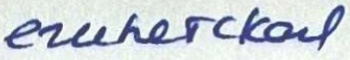египетская
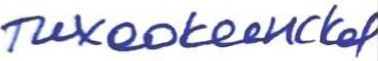тихоокеанская
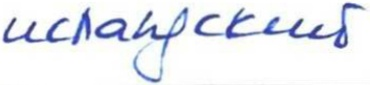исландский
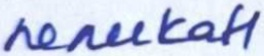пеликан
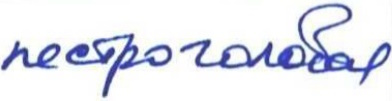пестроголовая
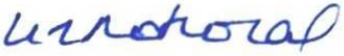иглоногая
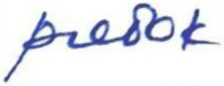рябок
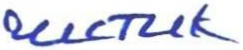чистик
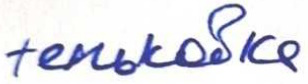теньковка
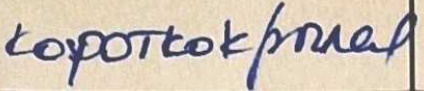короткокрылая
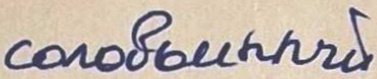соловьинный
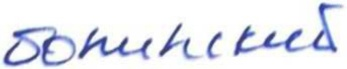бонинский
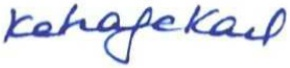канадская
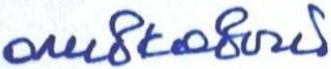оливковый
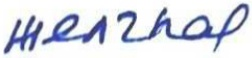желчная
